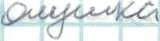олушка
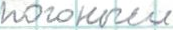погоныш
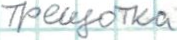трещотка
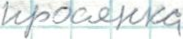просянка
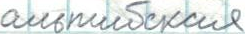альпийская
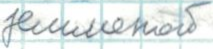земляной
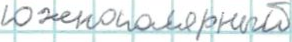южнополярный
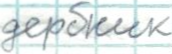дербник
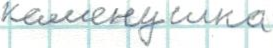каменушка
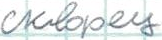скворец
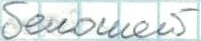белошей
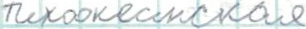тихоокеанская
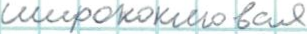ширококлювая
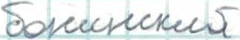бонинский
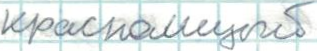краснолицый
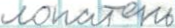лопатень
